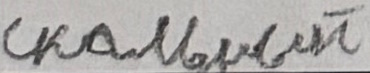скальный
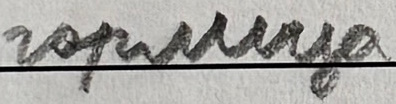горлица
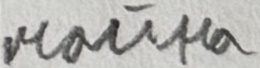майна
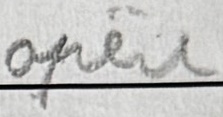орёл
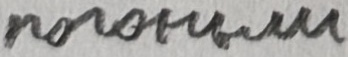погоныш
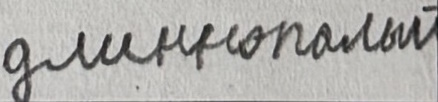длиннопалый
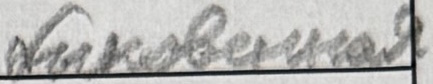быковенная
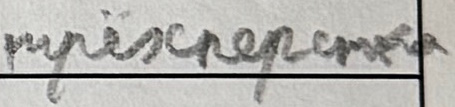трёхперстка
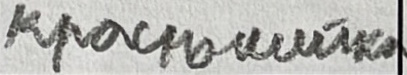красношейка
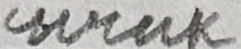сычик
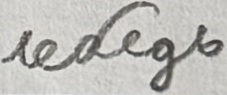лебедь
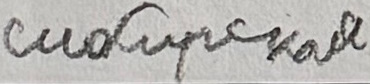сибирская
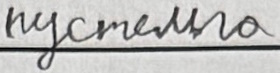пустельга
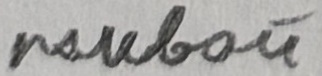полевой
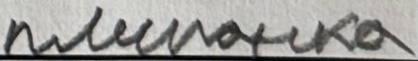плешанка
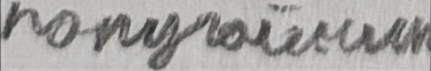попугайчик
